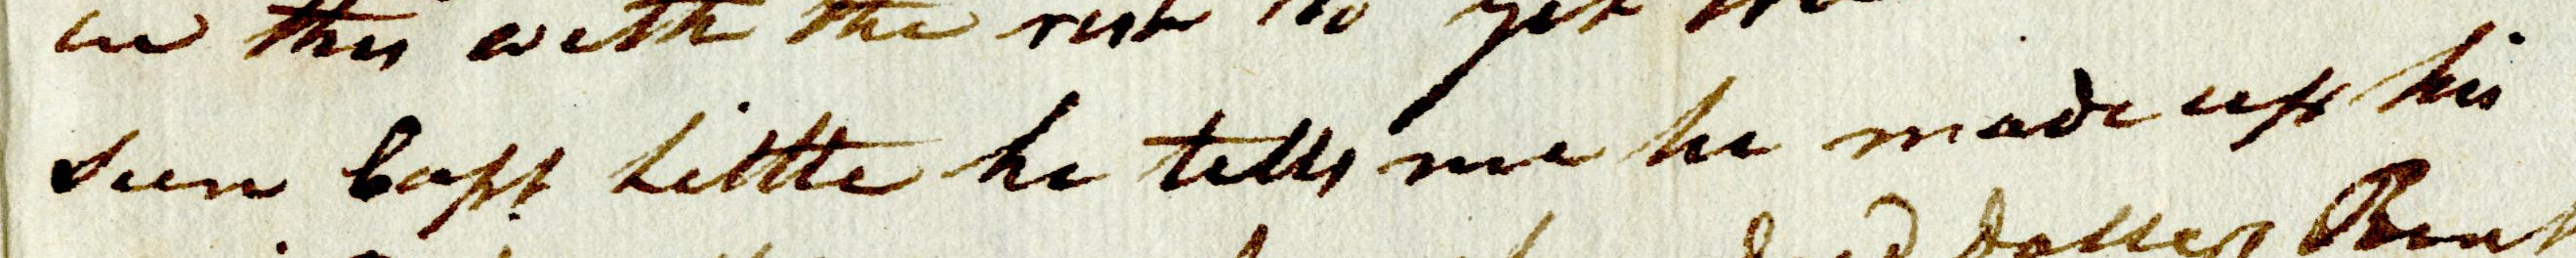seen Cap^t Little he tells me he made up his
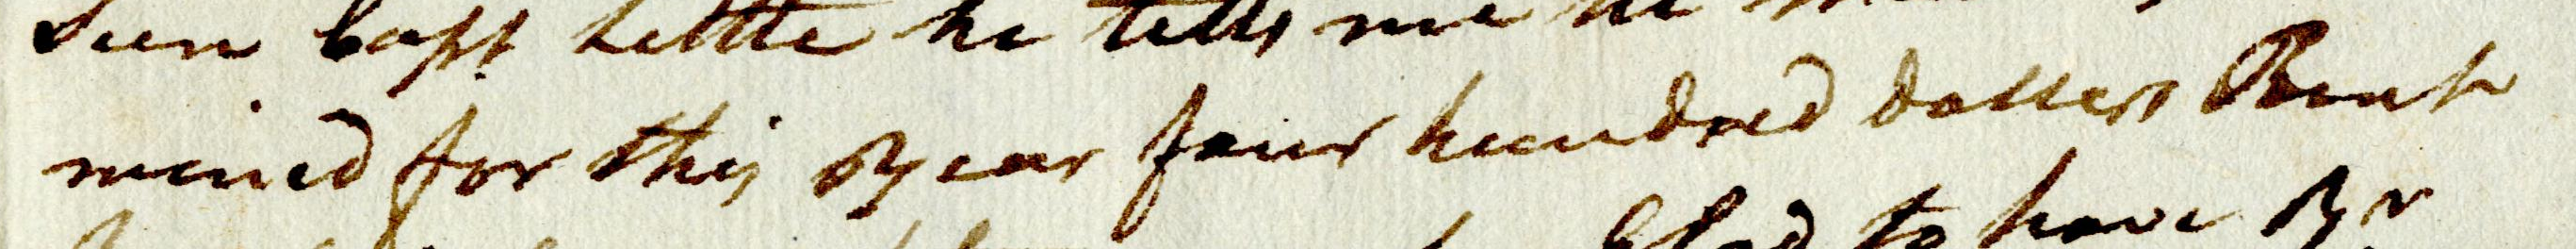mined for this year four hundred dollars Bank
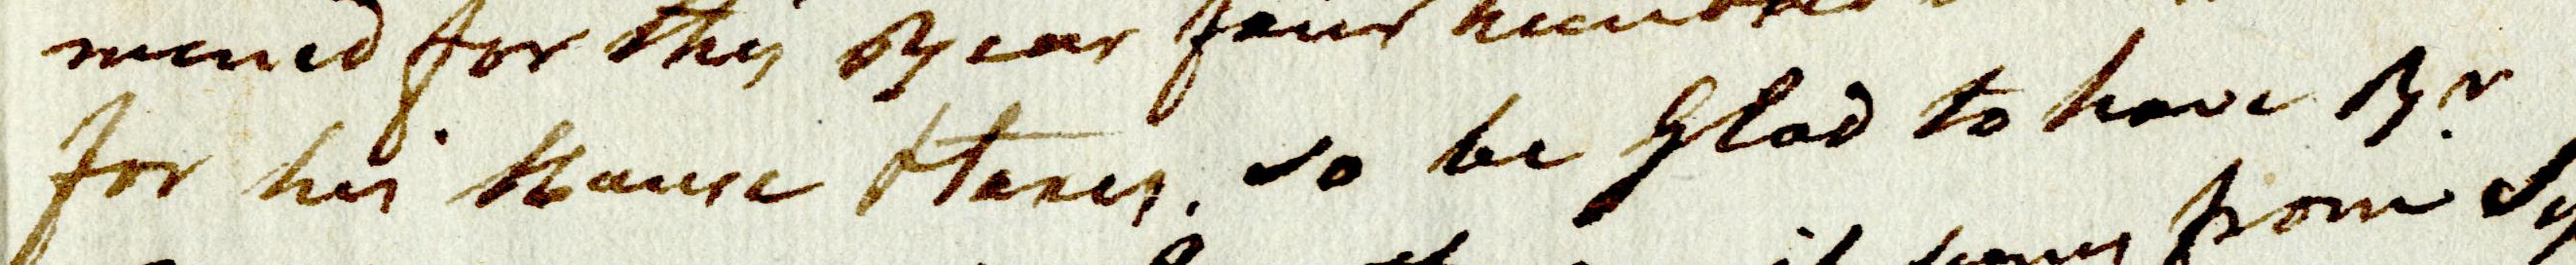for his House story, so be glad to have Y^r.
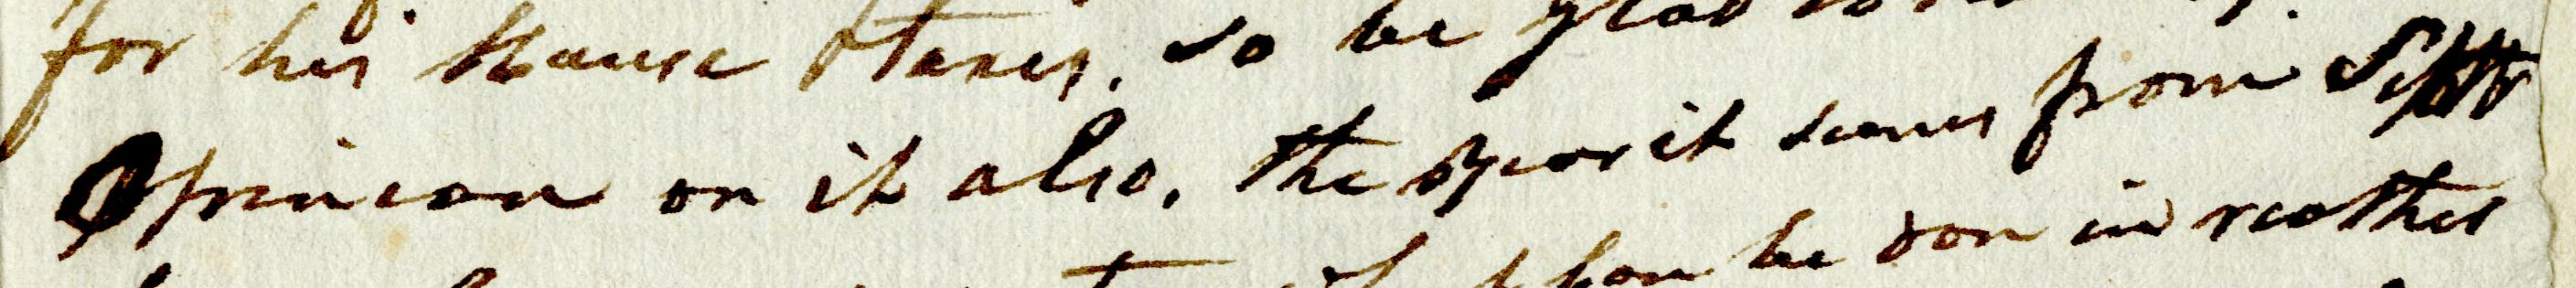opinion on it also, the year it seems from Supp^t
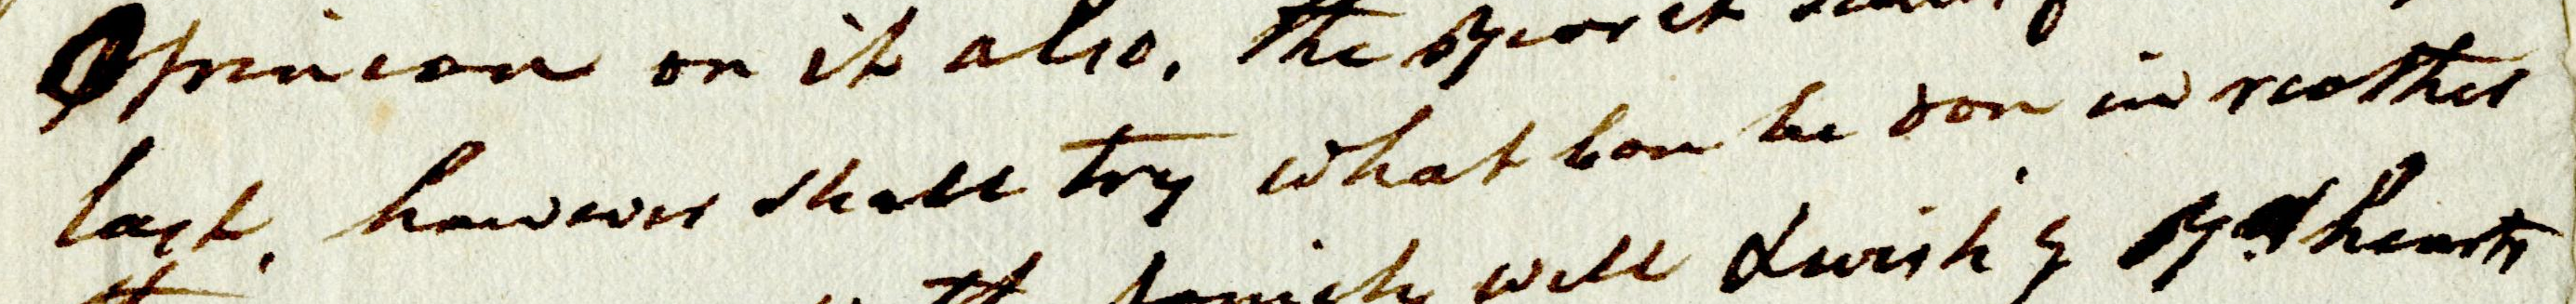last, however shall try what Can be don in rather
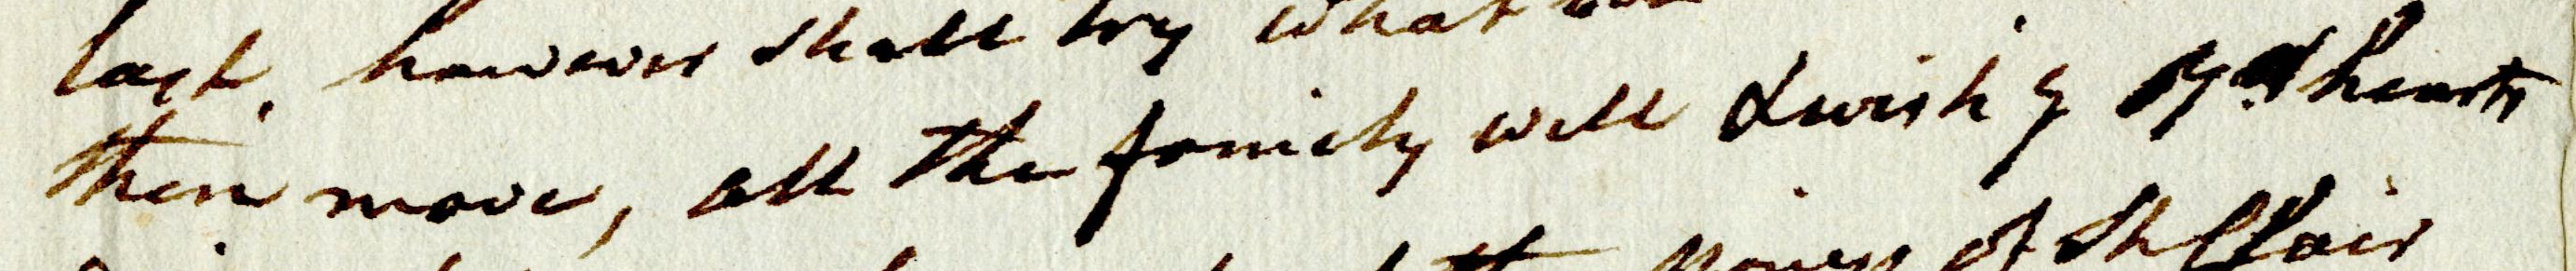then move, all the family well & wish'g y^r. hearts
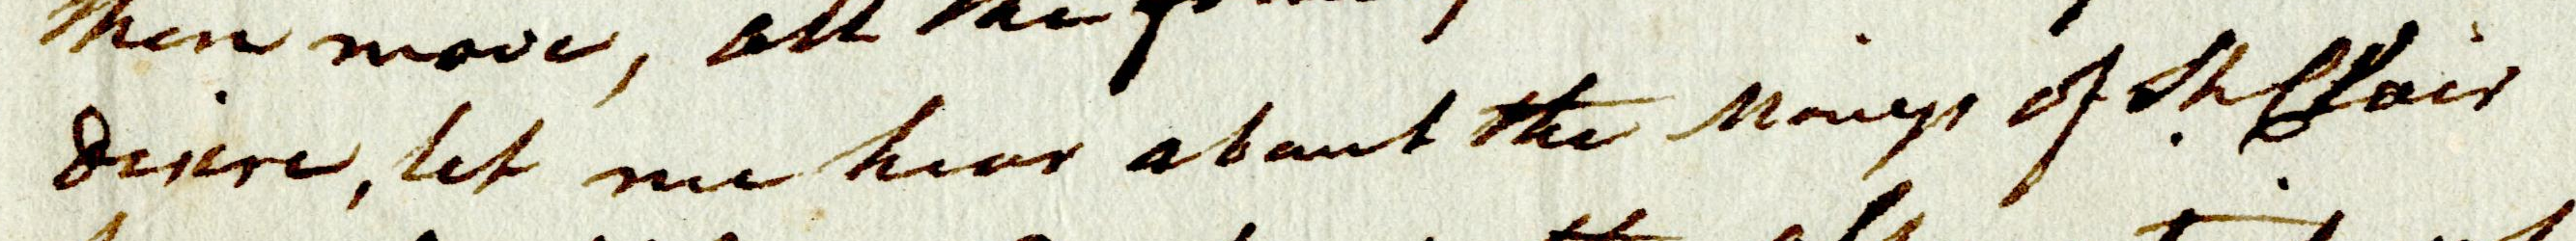desire, let me hear about the Minys of St Clair
